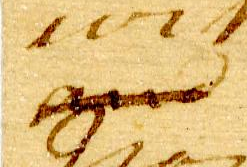[are]
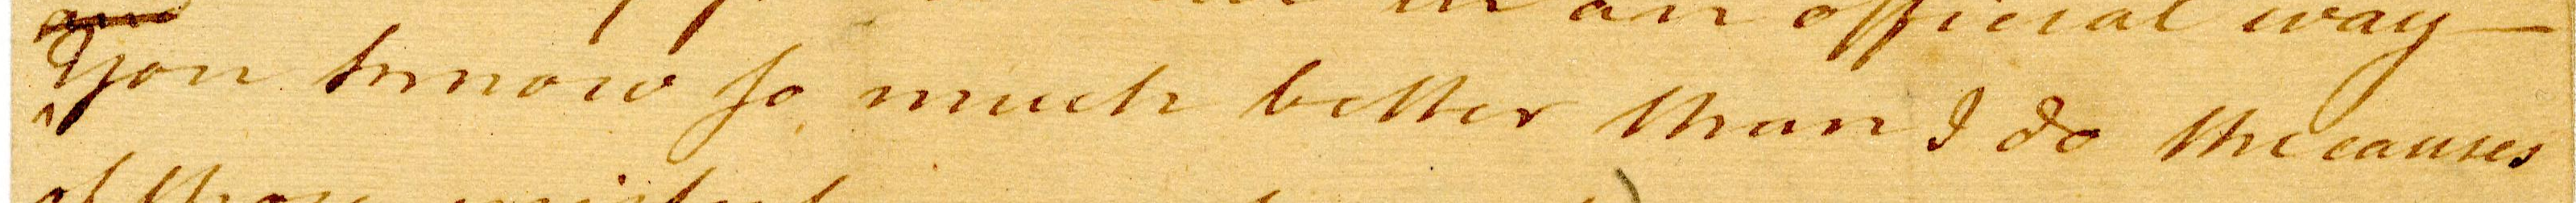You know so much better than I do the causes
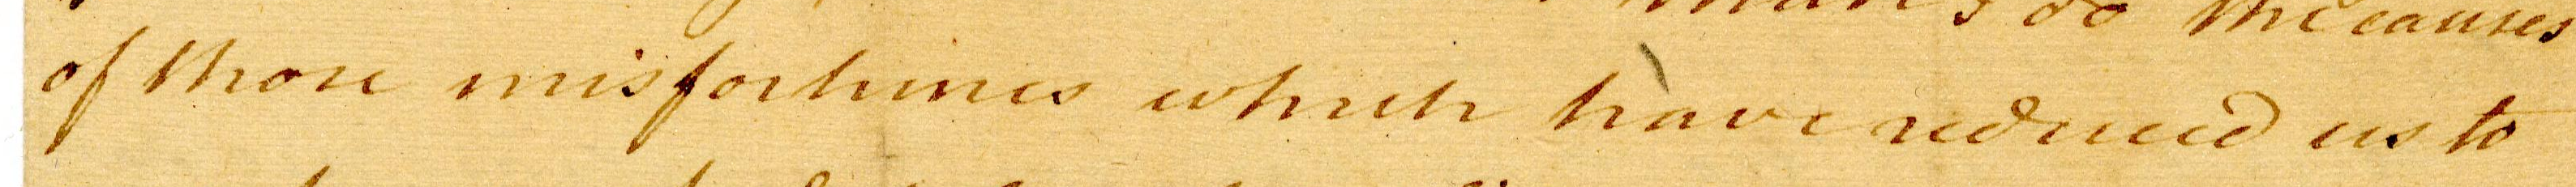of those misfortunes which have reduced us to
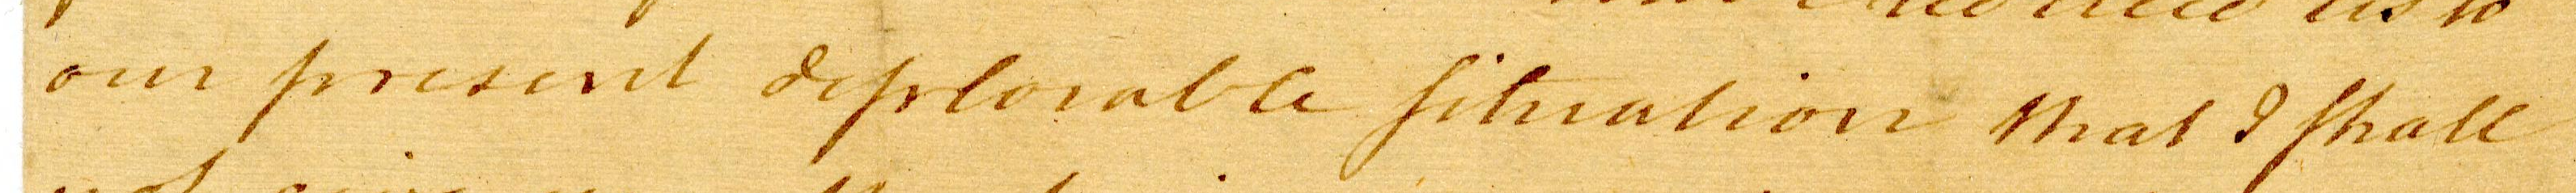our present deplorable situation that I shall
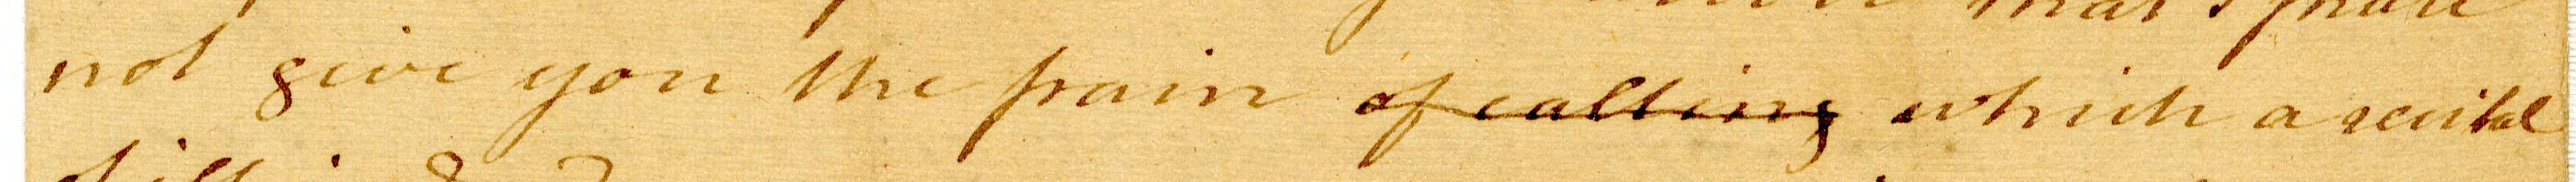not give you the pain [of calling] which a recital
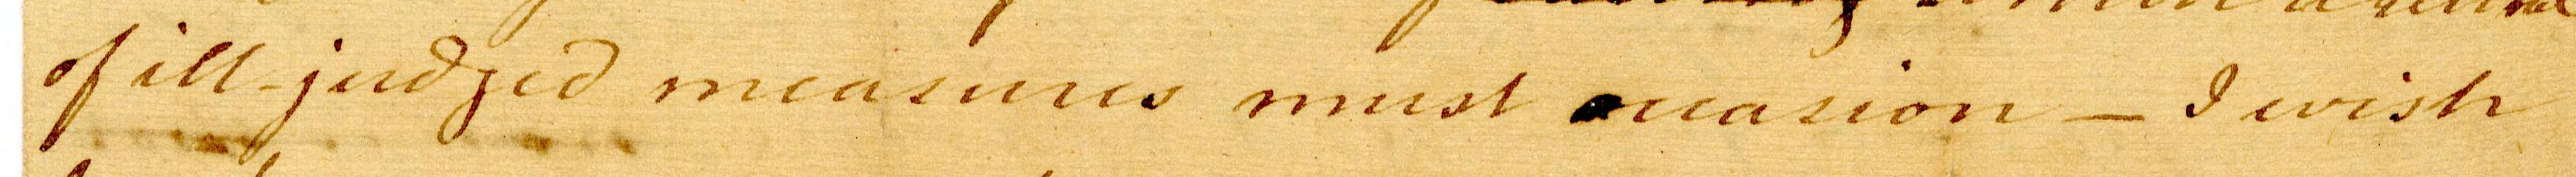of ill-judged measures must occasion- I wish
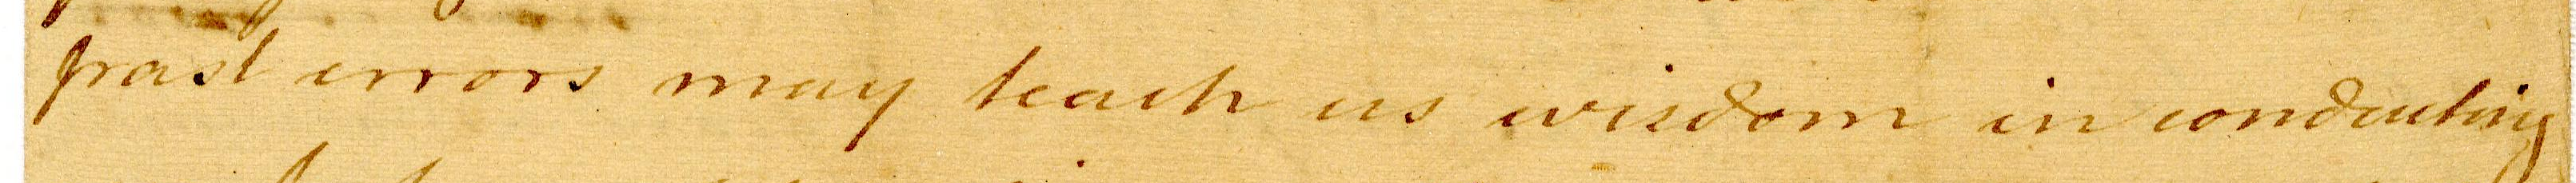past errors may teach us wisdom in conducting
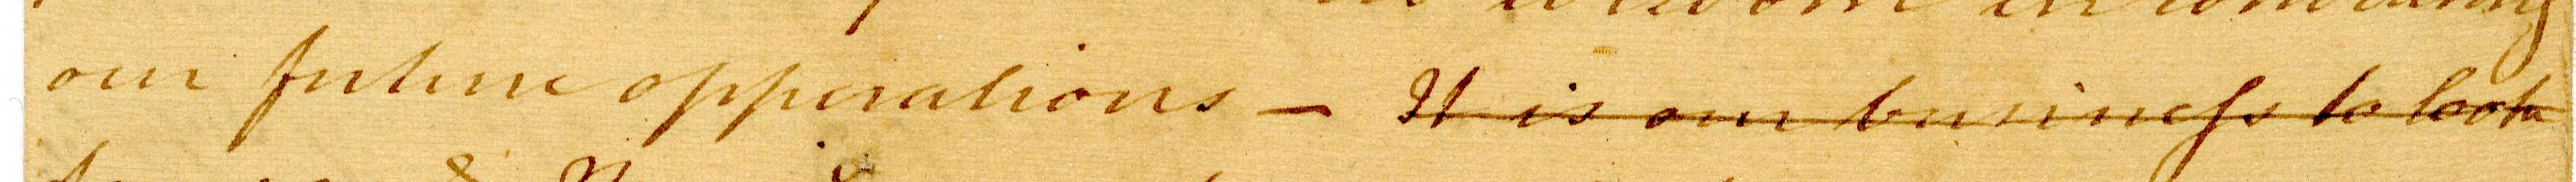our future opperations- [It is our business to look]
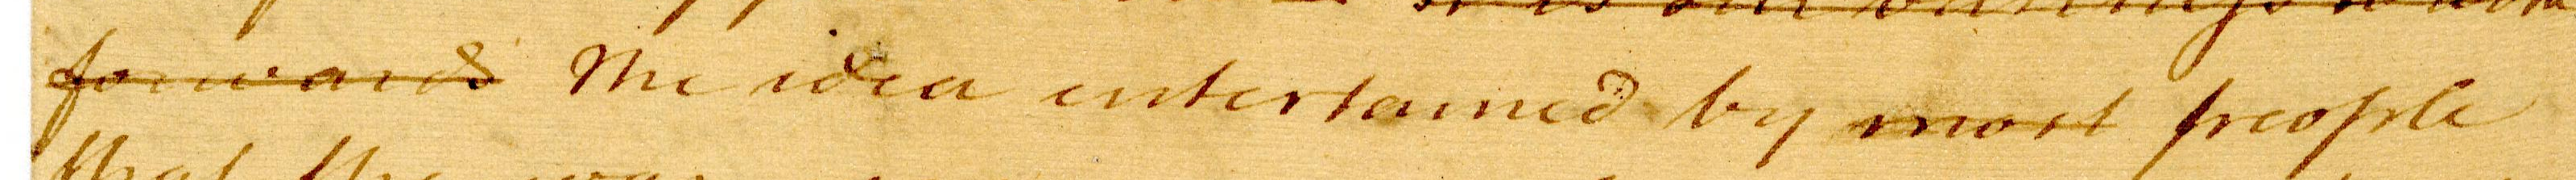[forwards] the idea entertained by [most] people
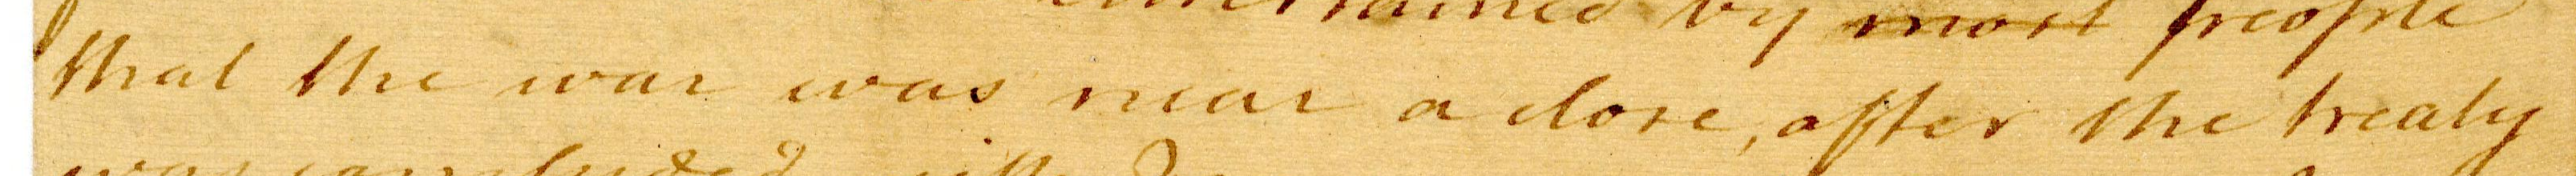that the war was near a close, after the treaty
